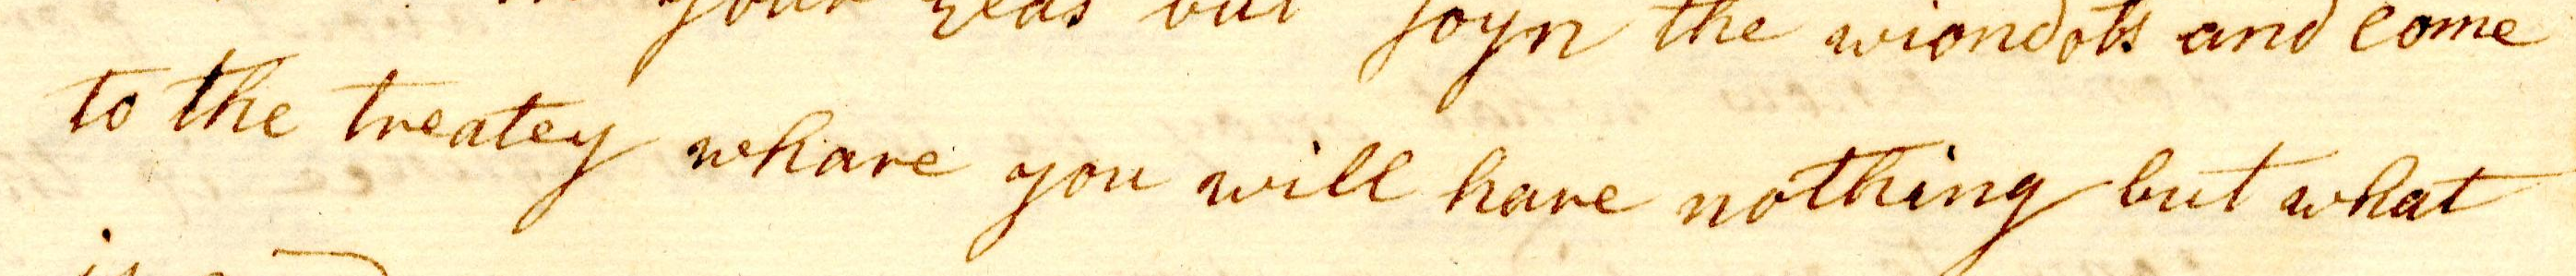to the treatey whare you will have nothing but what
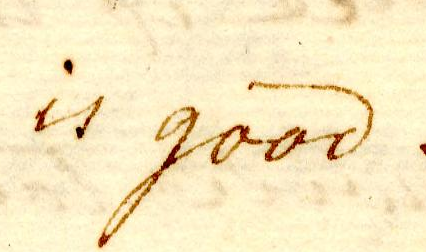is good-
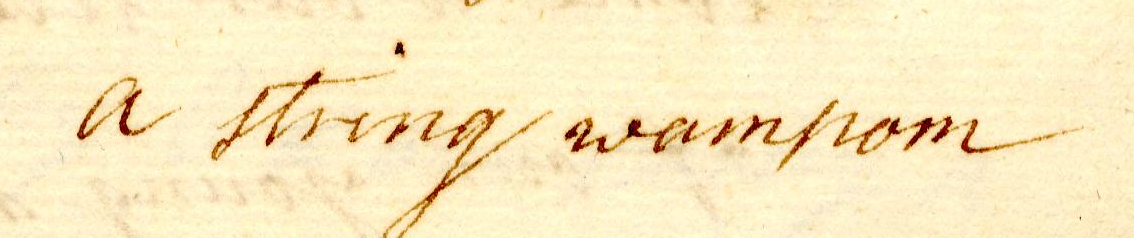a string wampom
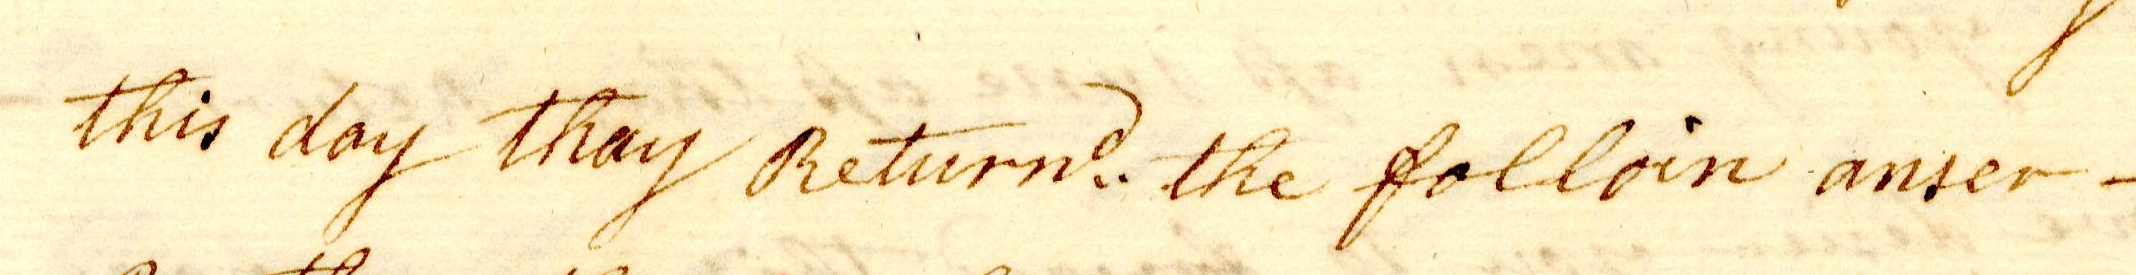this day thay Return^d. the folloin anser-
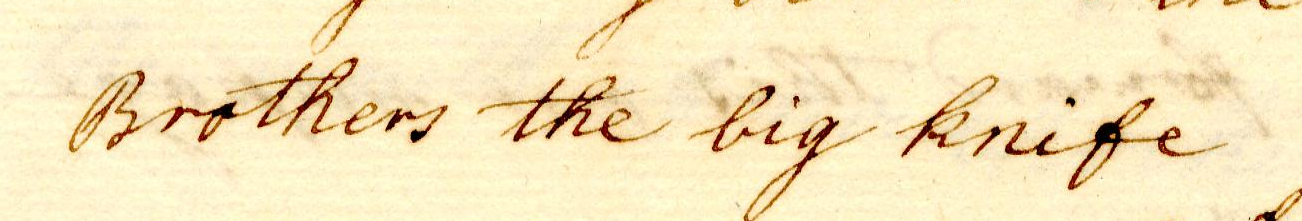Brothers the big knife
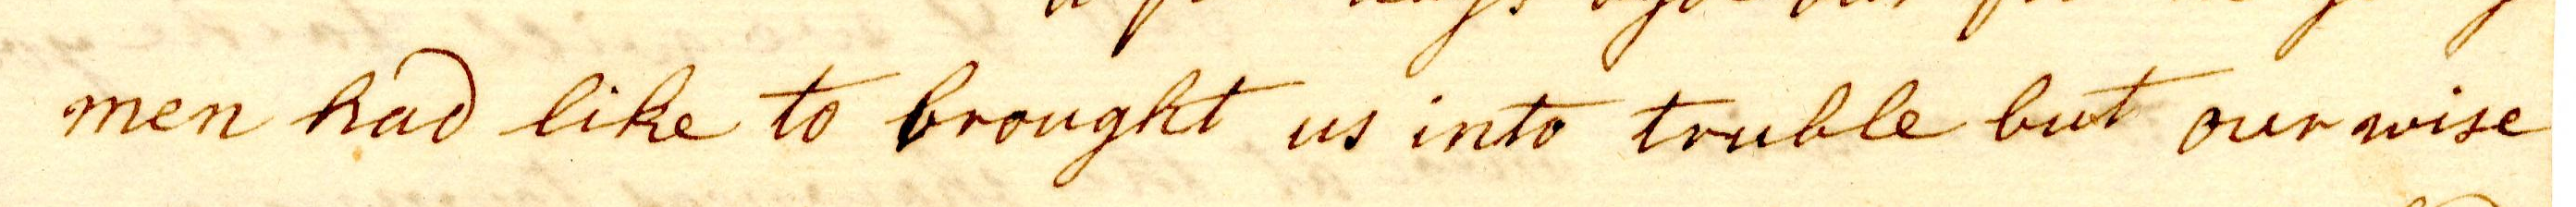men had like to brought us into truble but our wise
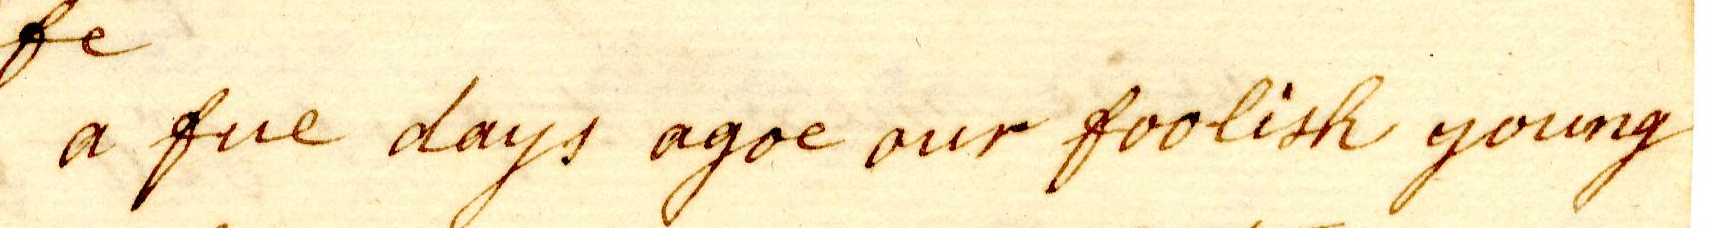a fue days agoe our foolish young
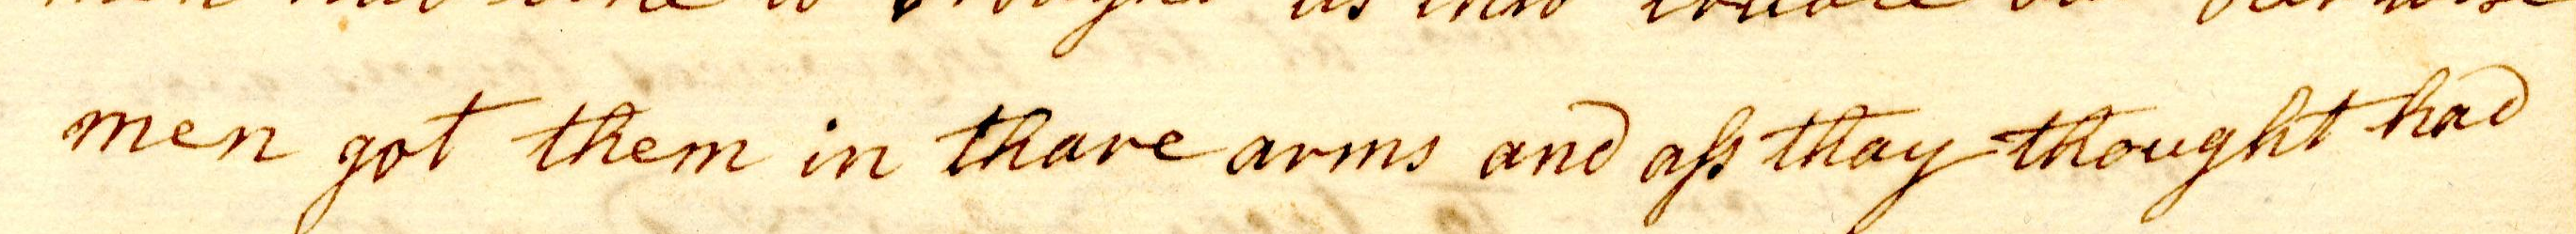men got them in thare arms and ass thay thought had
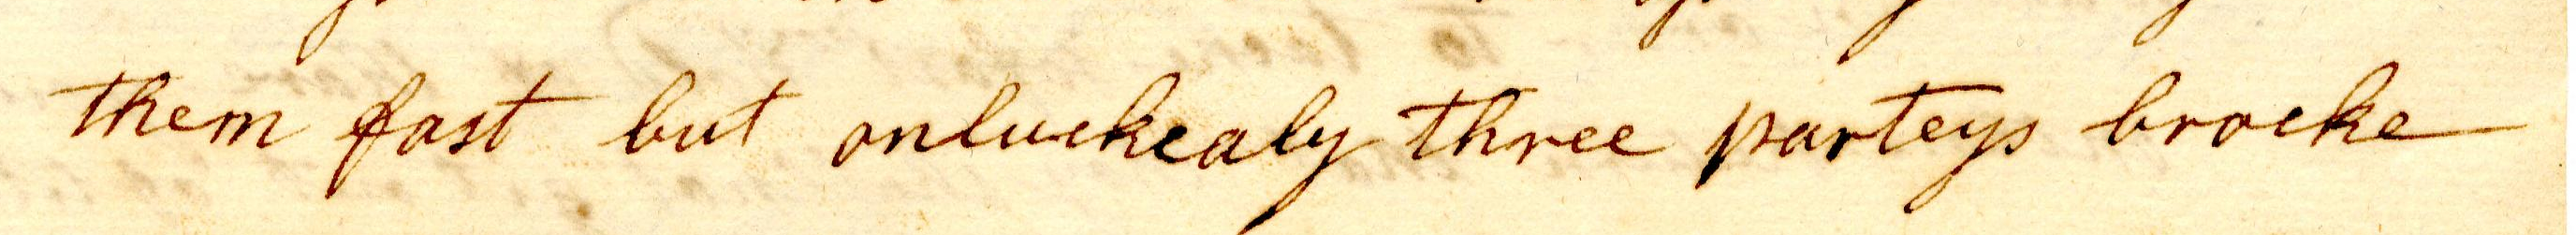them fast but onluckealy three parteys brocke
